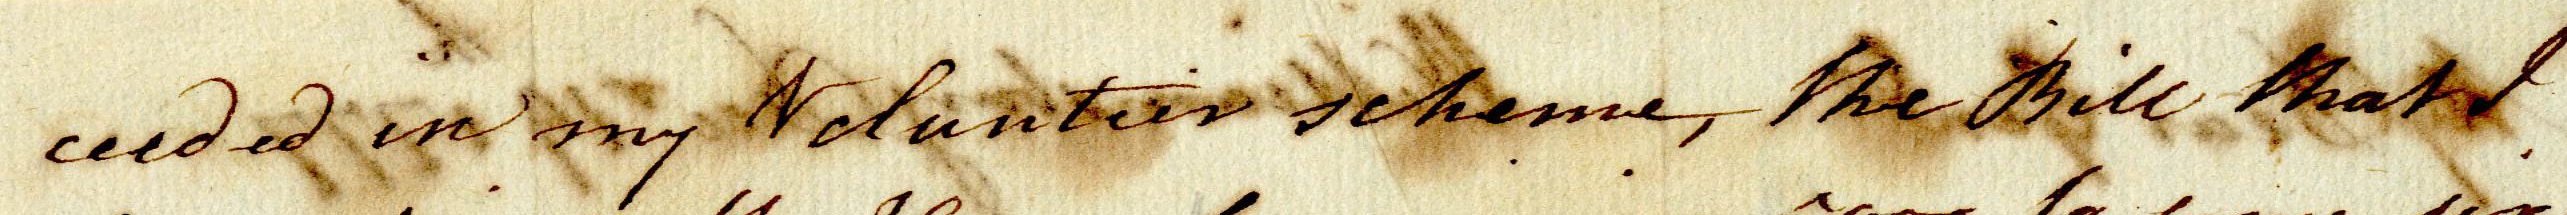ceeded in my Volunteer scheme, the Bill that I
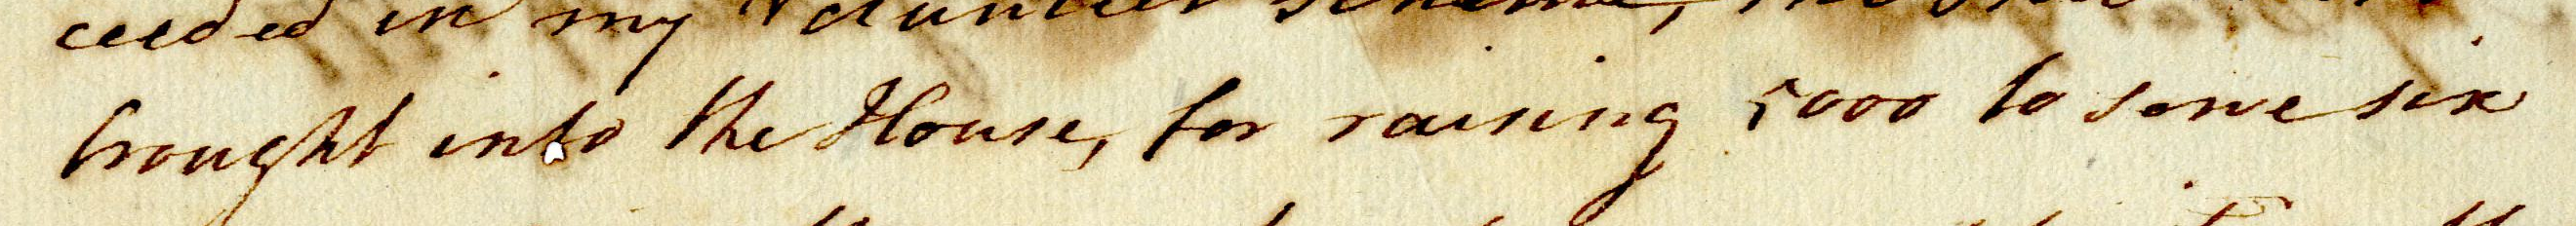bought into the House, for raising 5000 to some six
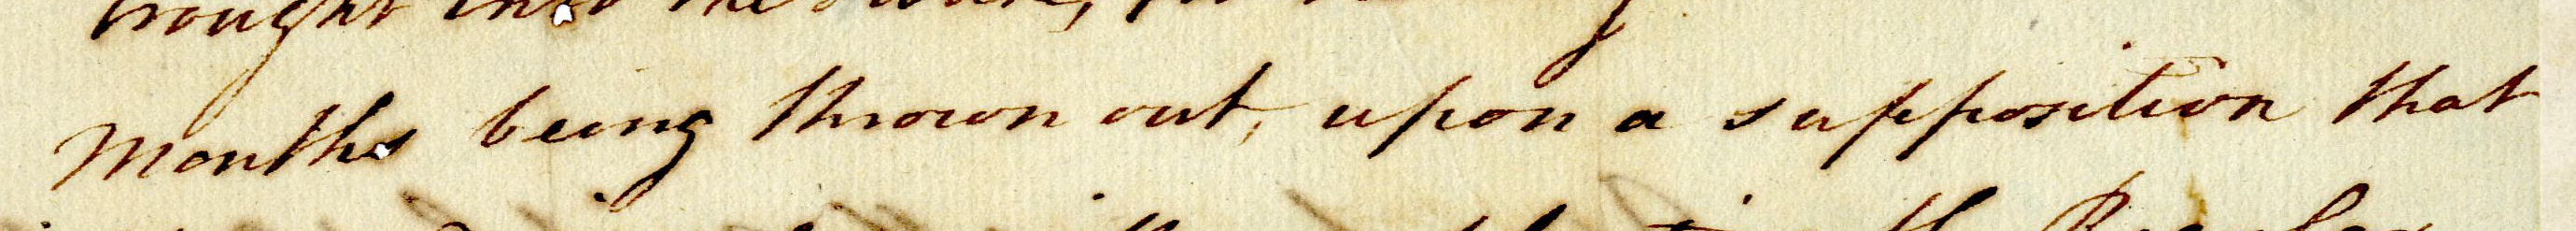months being thrown out, upon a supposition that
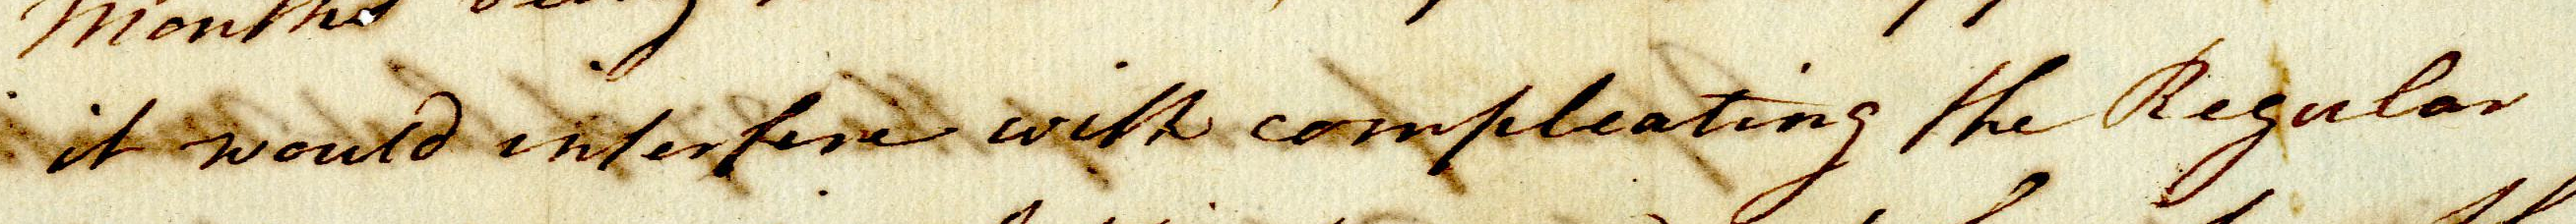it would interfere with compleating the Regular
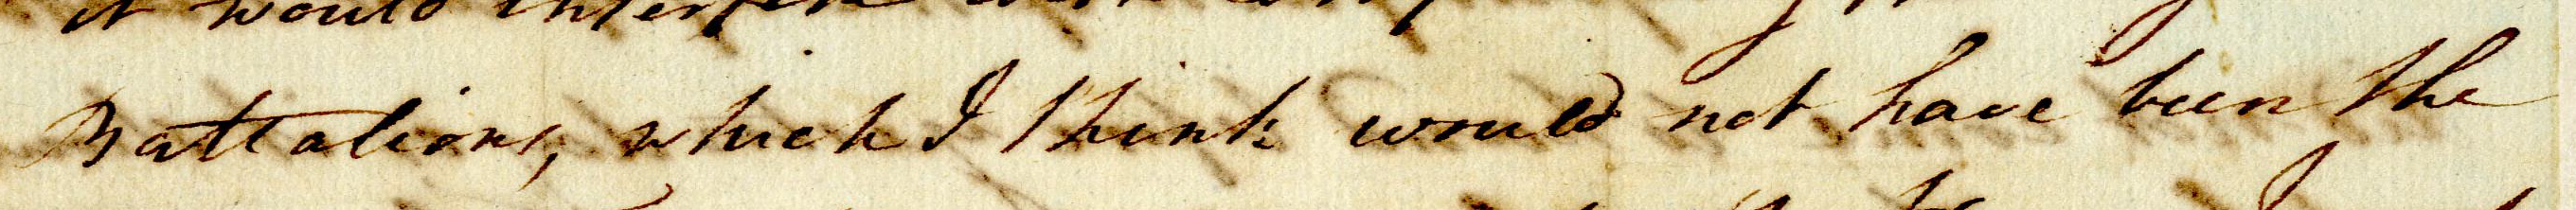Battalions, which I think would not have been the
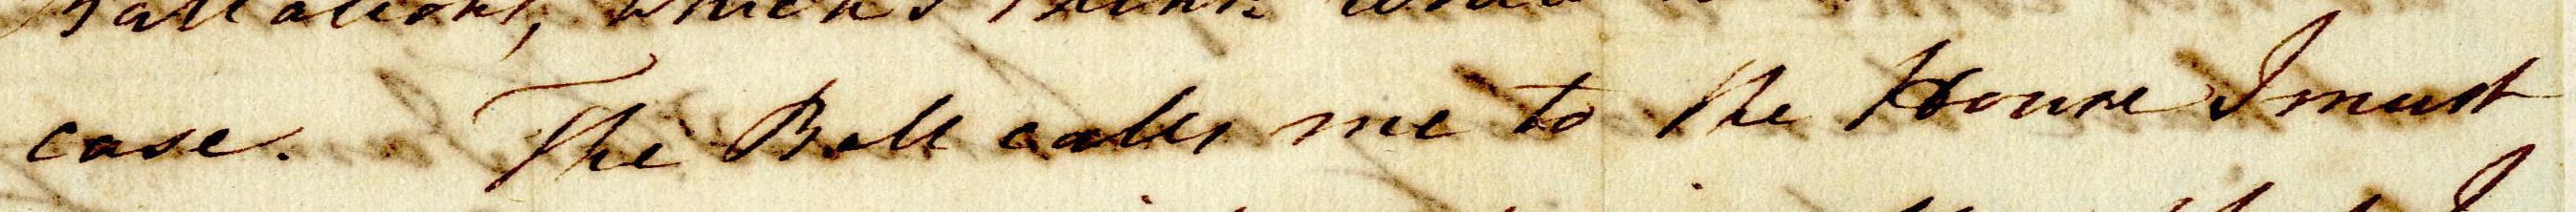case. The Ball calls me to the House I must
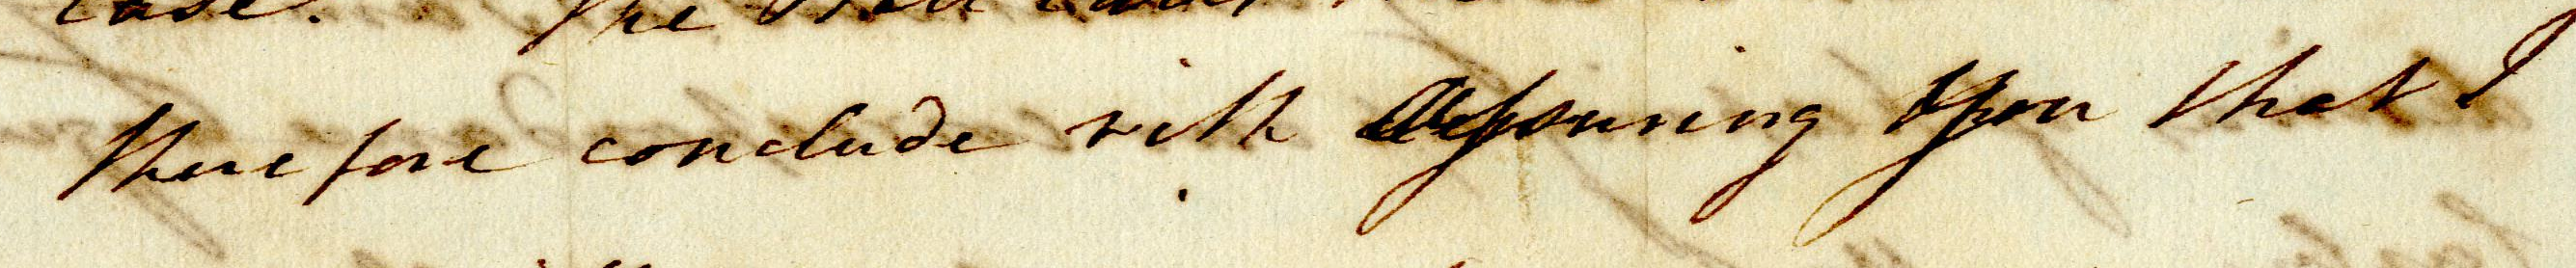therefore conclude with Assuring You that I
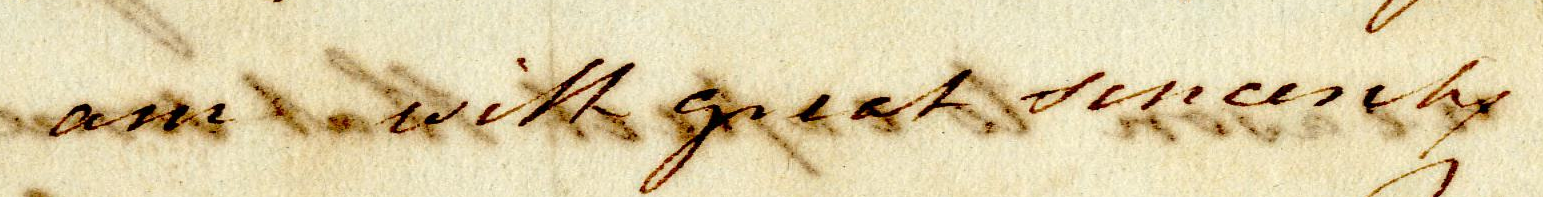am with great sincerity
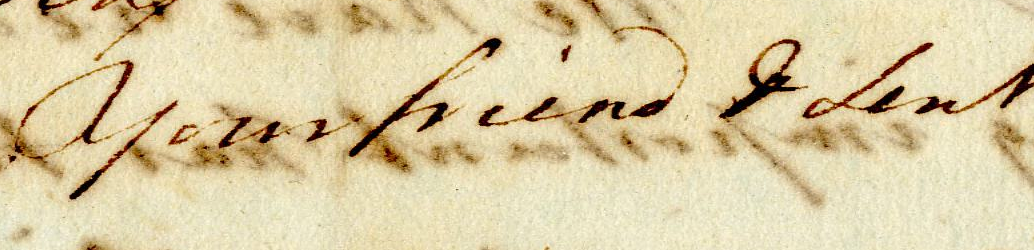Your friend & Ser^t
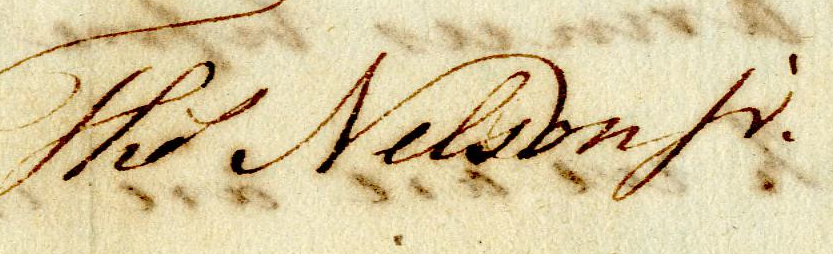Tho^s Nelson jr
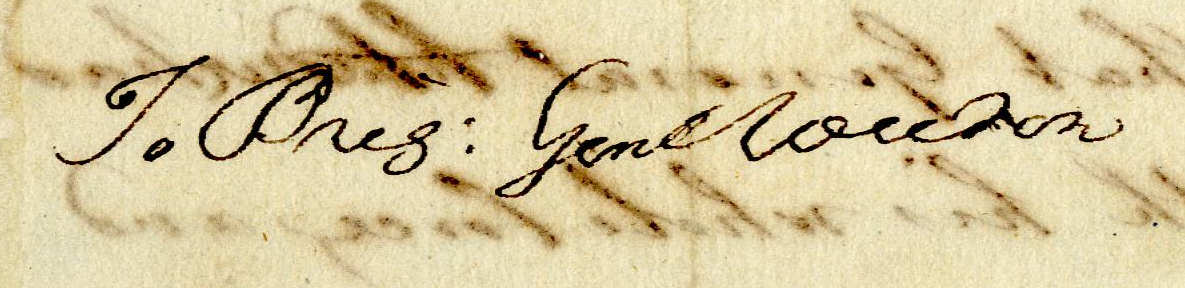To Brig: Gen^l Weedon
